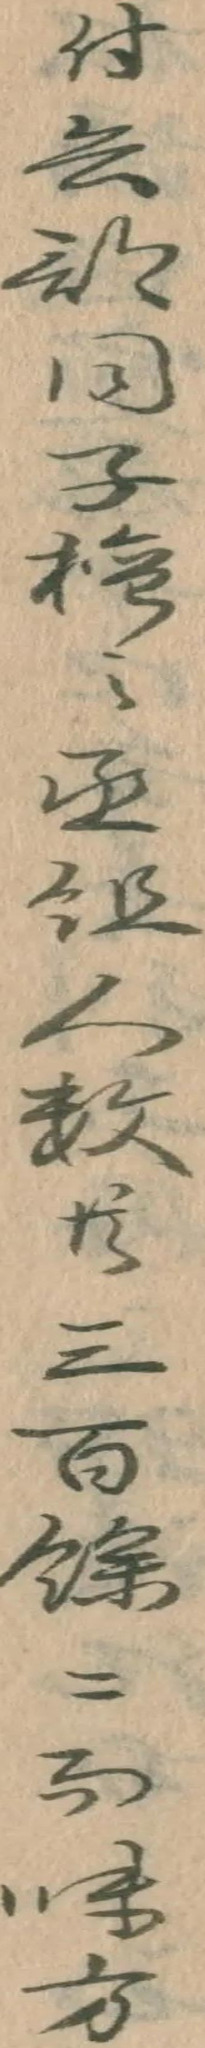付兵部同子権之丞組人数共三百余に而味方
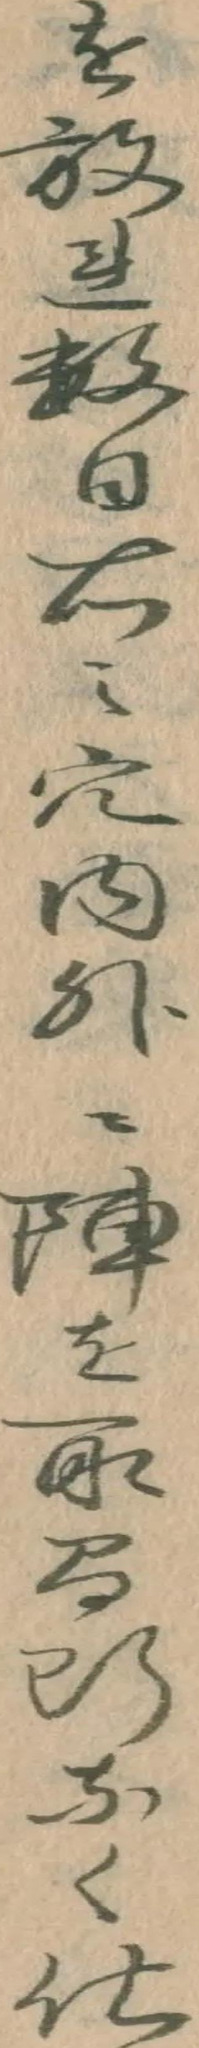を放連数日右之穴内外に陣を取間断なく仕
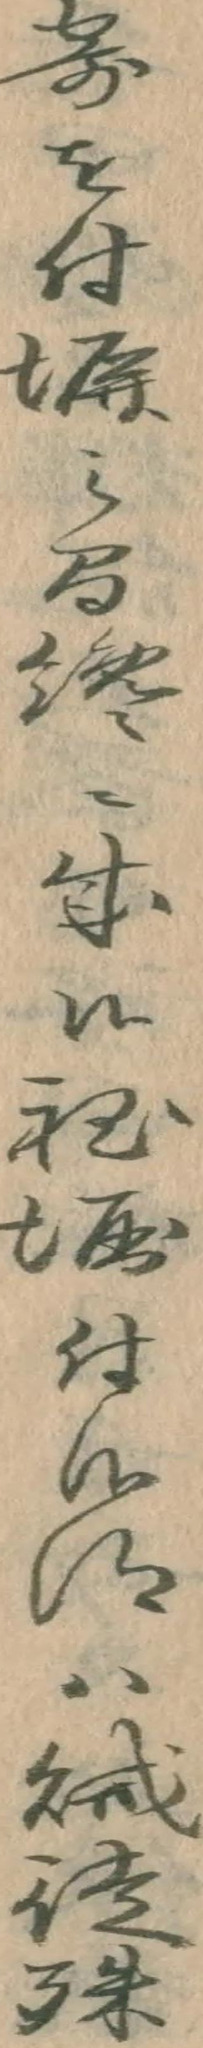寄を付塀之間纔に成候程塀付候得は賊徒殊
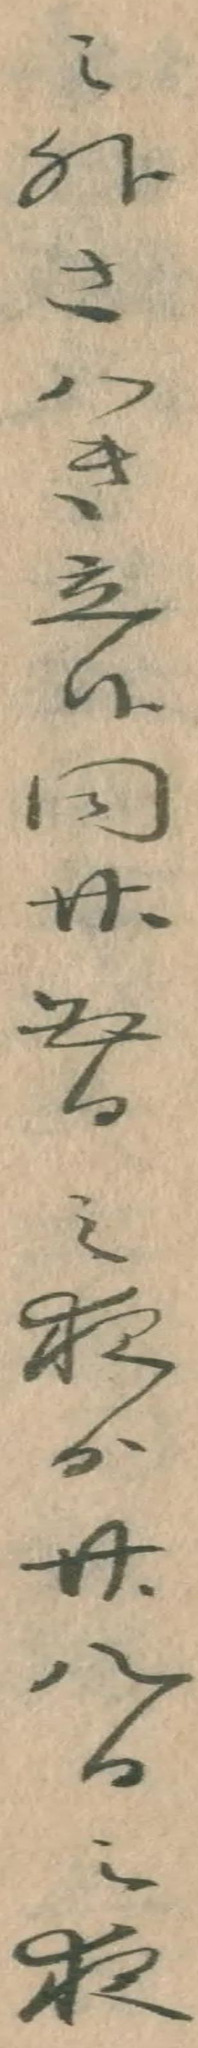之外さはき立候同廿五日之夜ゟ廿八日之夜
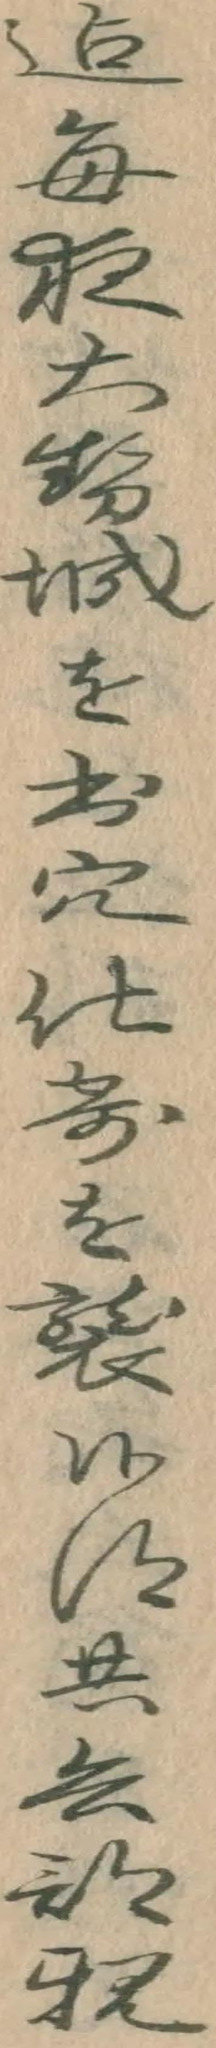迄毎夜大勢城を出穴仕寄を襲候得共兵部親
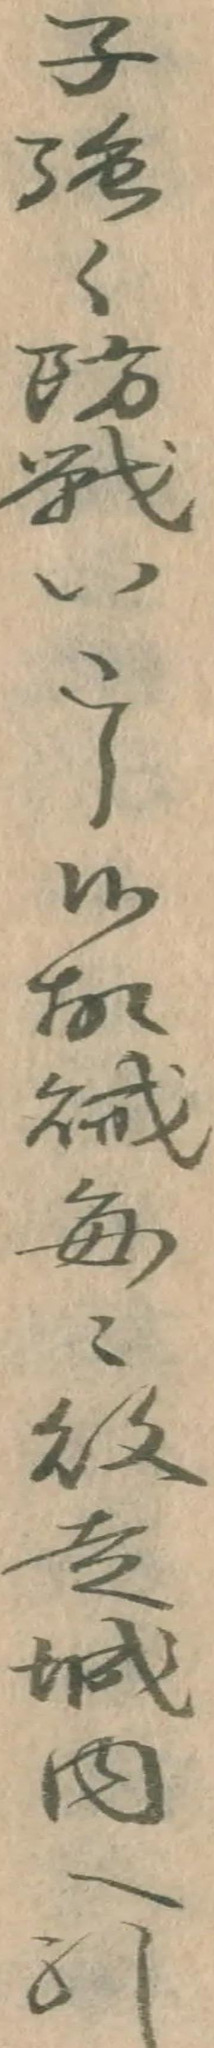子強く防戦いたし候故賊毎々敗走城内へ引
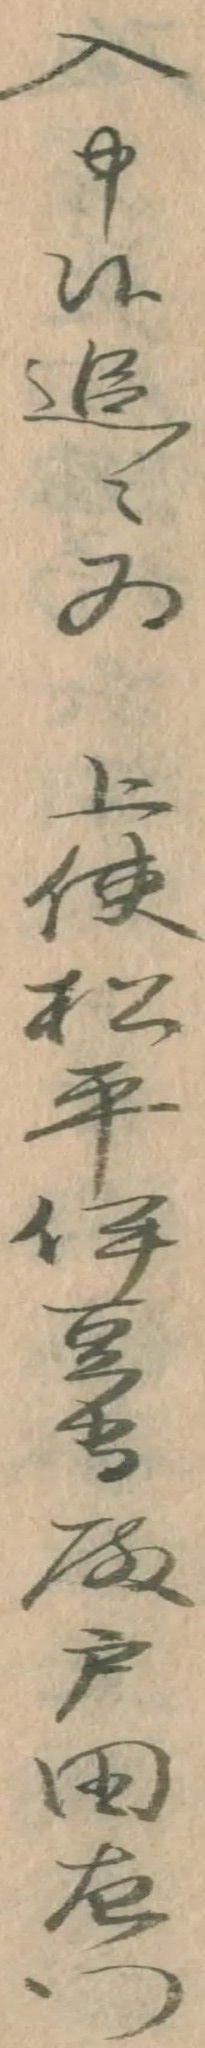入申候追々ゐ上使松平伊豆守殿戸田左門

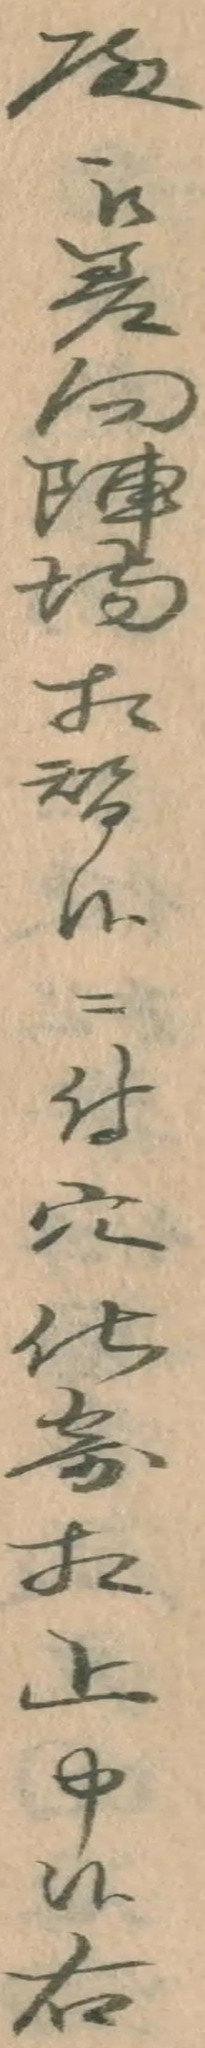殿被差向陣場相替候に付穴仕寄相止申候右
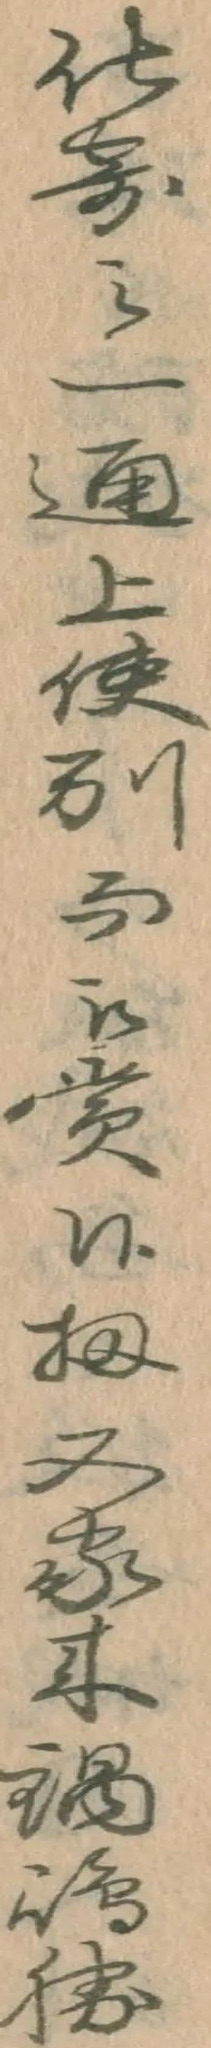仕寄之一通上使別而被賞候扨又家来鍋島勝
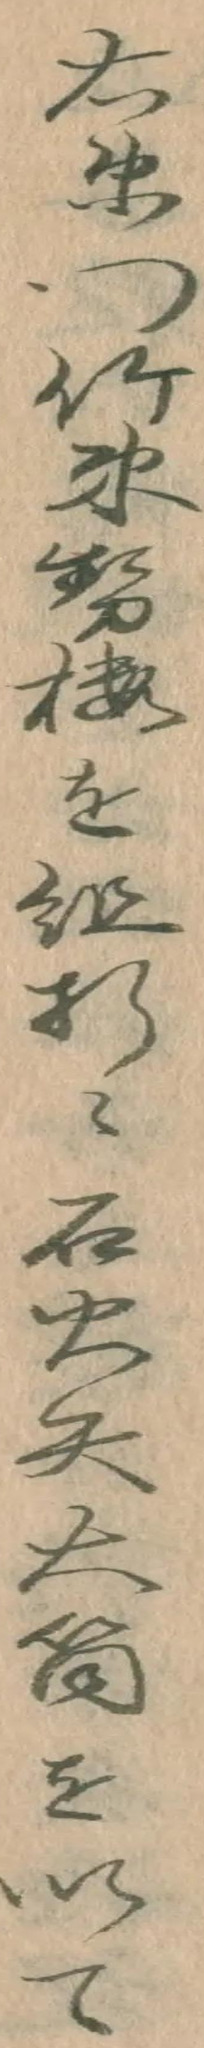右衛門竹束勢樓を組折々石火矢大筒を以て
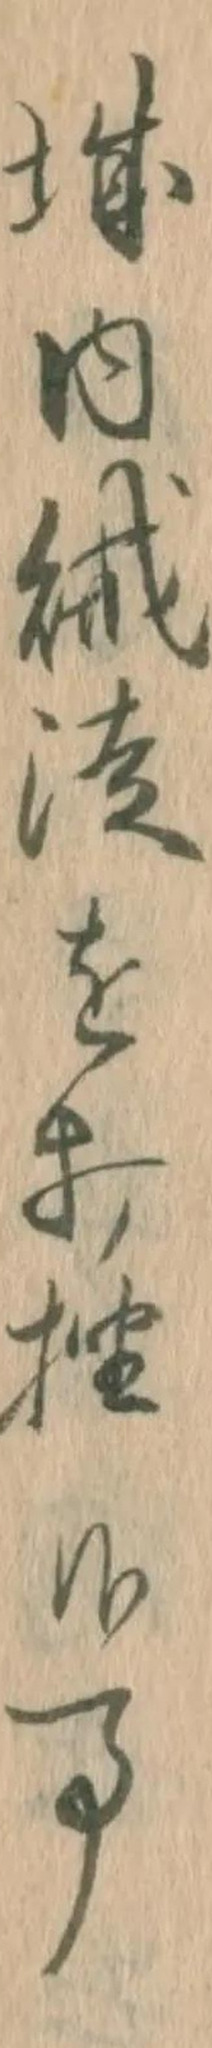城内賊徒を打挫候事
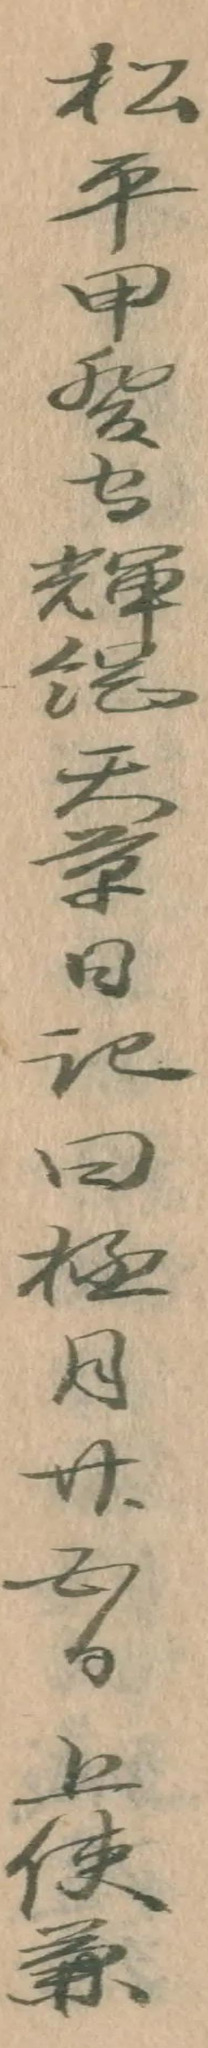松平甲斐守輝綱天草日記曰極月廿五日上使兼
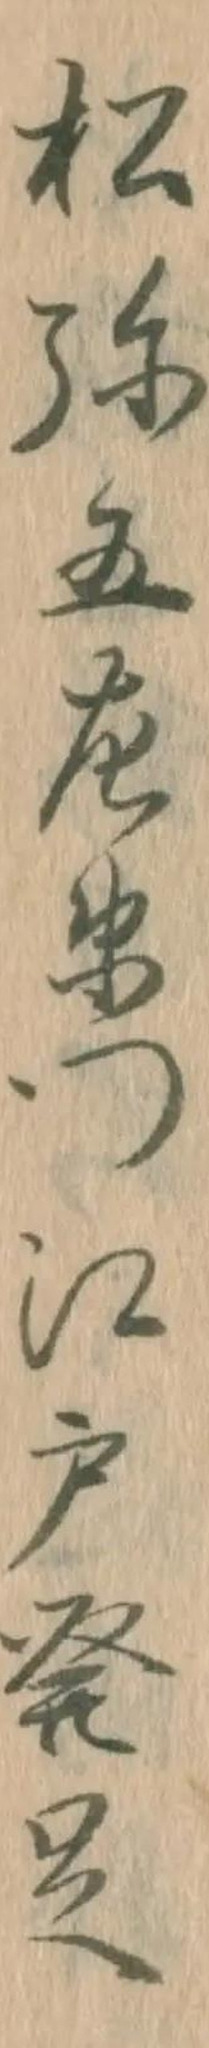松弥五左衛門江戸発足
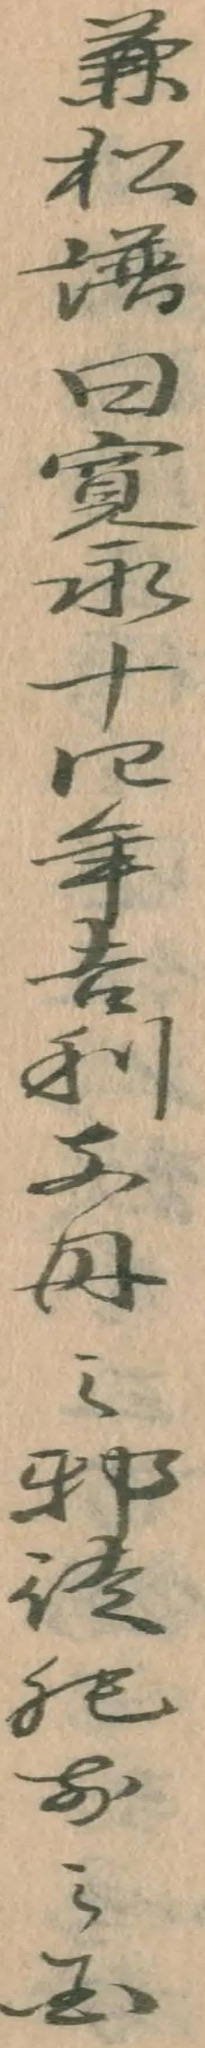兼松譜曰寛永十四年吉利支丹之邪徒肥前之国
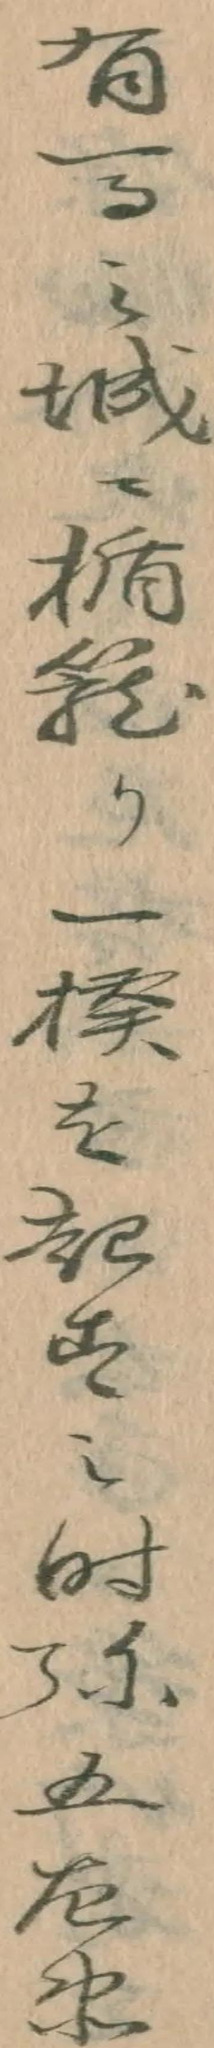有馬之城に楯籠り一揆を起春之時弥五左衛
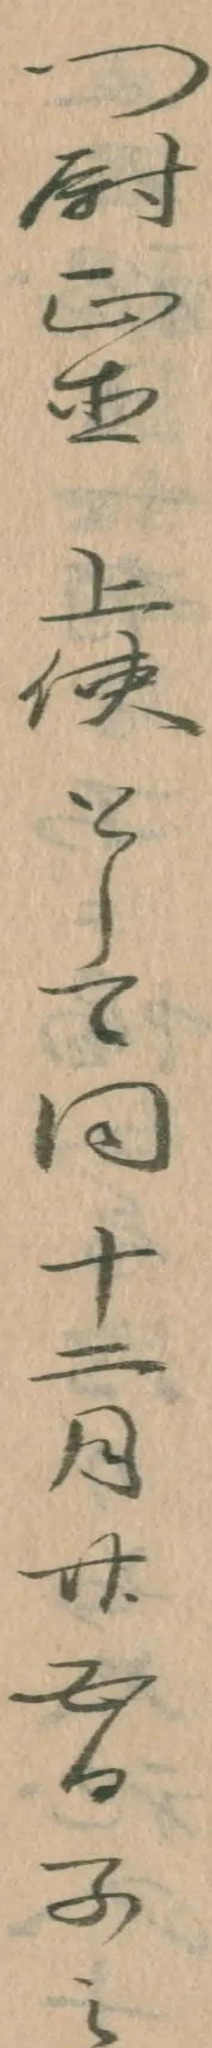門尉正直上使として同十二月廿五日子之
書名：切支丹御退治記 49巻. [4]
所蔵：国立国会図書館 National Diet Library, JAPAN
